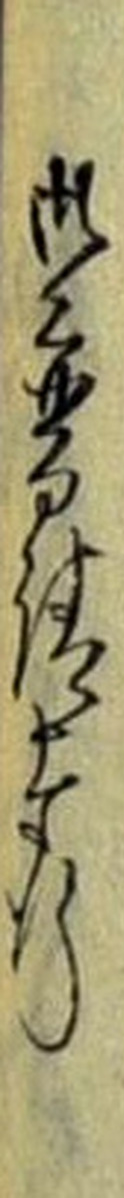御普請奉行
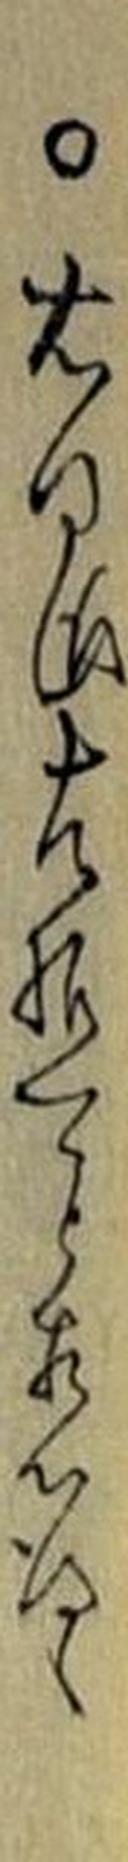○右同趣左様可被相心得候
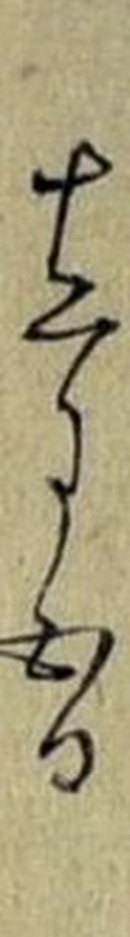十二月五日
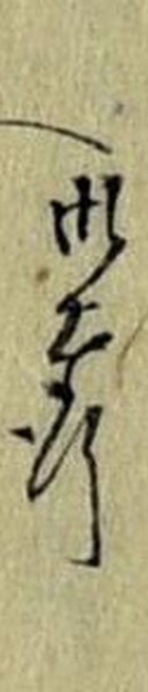御奉行
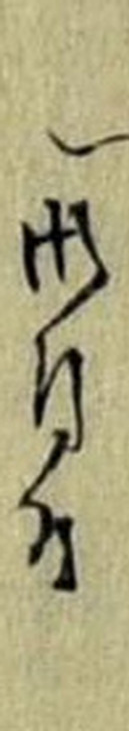御目付
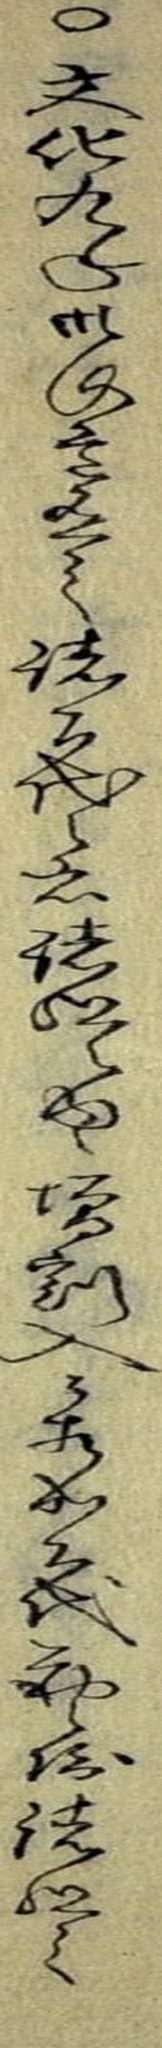○文化九年御趣意有之諸下代之者諸組之内増割入ニ相成下代勤之儀諸組之
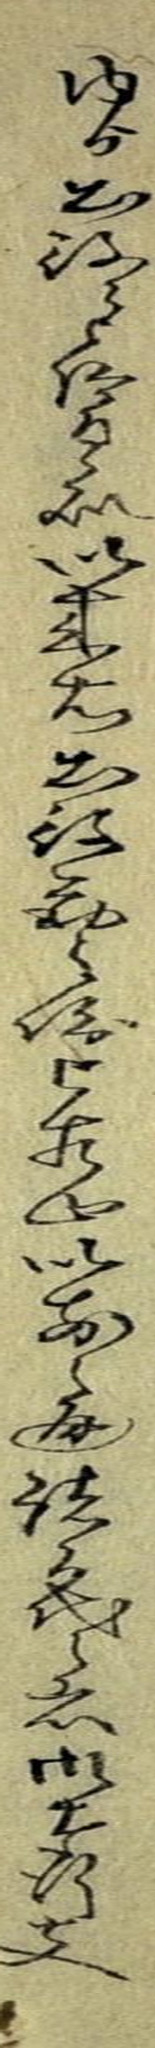内ゟ出役ニ被仰付候処以来右出役勤之儀被相止以前之通諸下代之者御奉行支
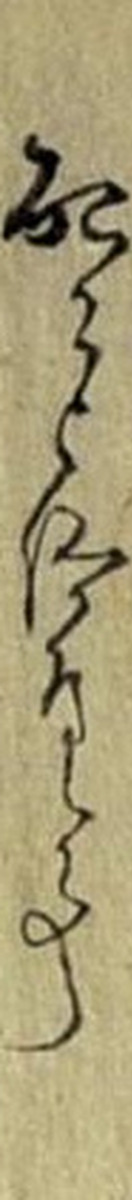配ニ被仰付候事
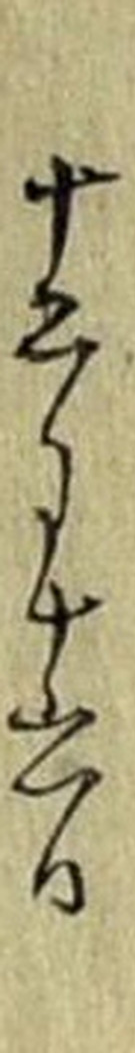十二月十六日
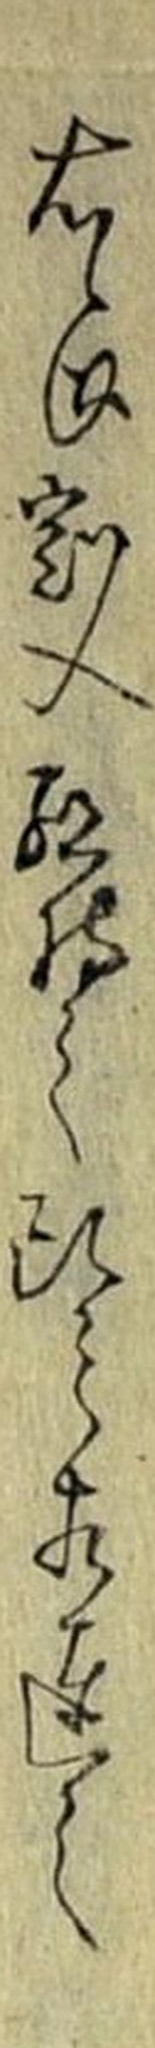右之趣割入組持之頭々相達之
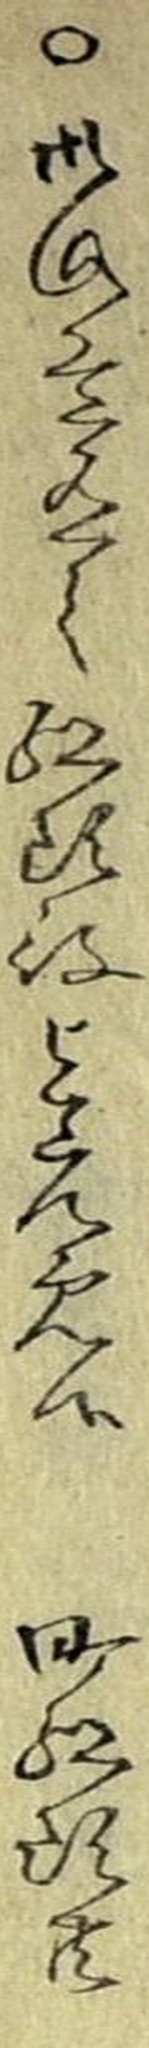○御趣意有之組頭役被差免候町組頭共
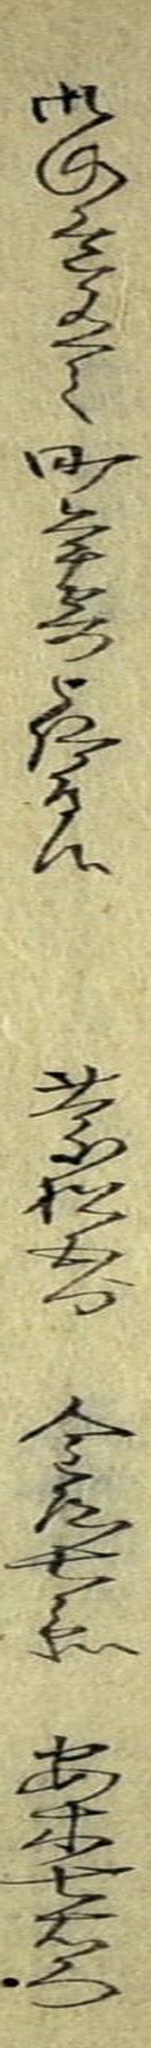御趣意有之町年寄被仰付候慶松五右衛門金屋七兵衛安木七右衛門
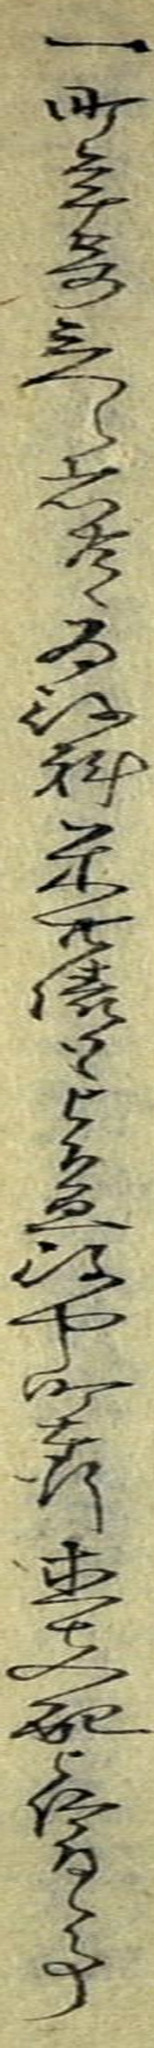一町年寄三人之者共へ為役料米廿俵ツヽ被下置役中町奉行直支配被仰付候事
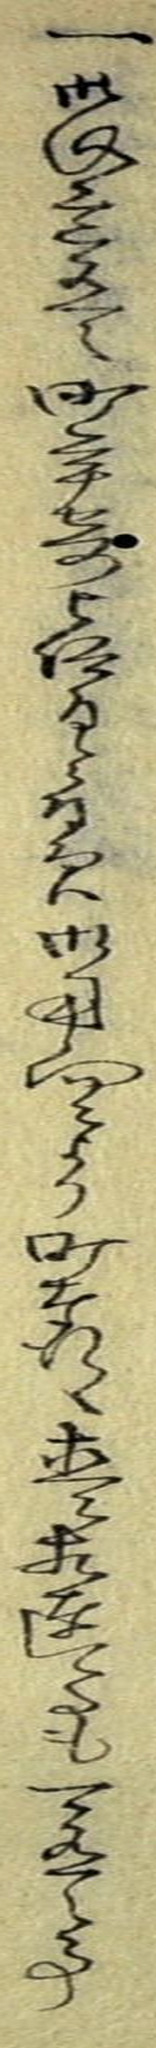一御趣意有之町年寄被仰付候ニ付而ハ御用向ニより町奉行へ直ニ相達候事も可有之事

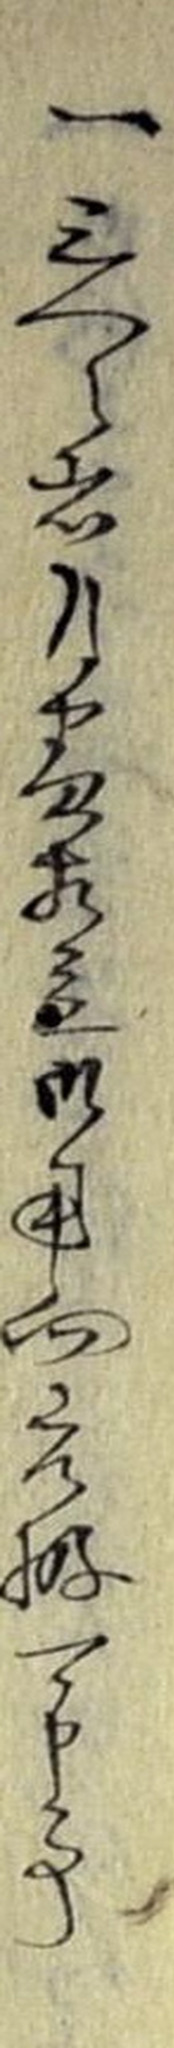一三人之者月番相立御用向取扱可申事
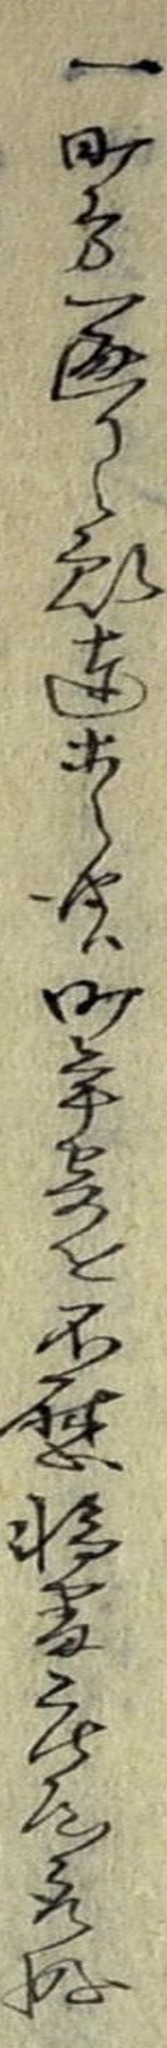一町方通り之願達等之儀ハ町年寄を不応輪番庄屋取扱
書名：命令之部 五
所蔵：福井県文書館 Fukui Prefectural Archives
